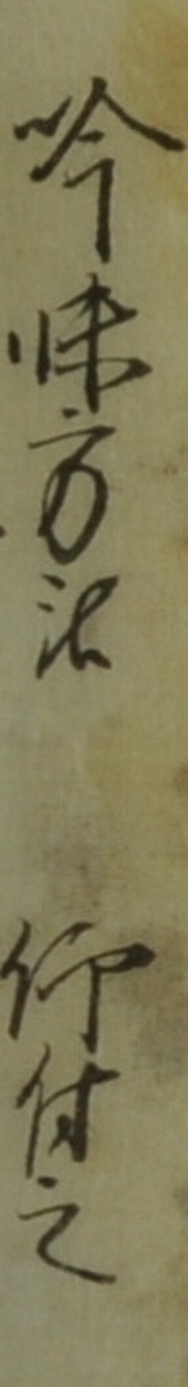吟味方被仰付之
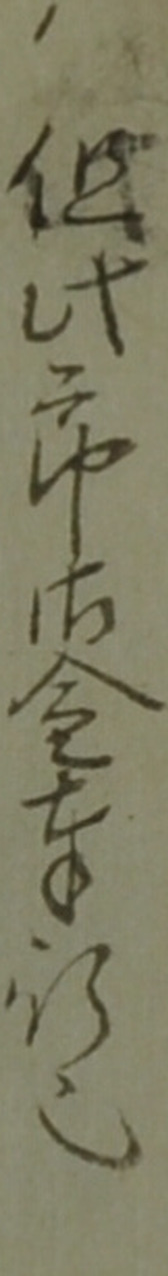但此節御金奉行也
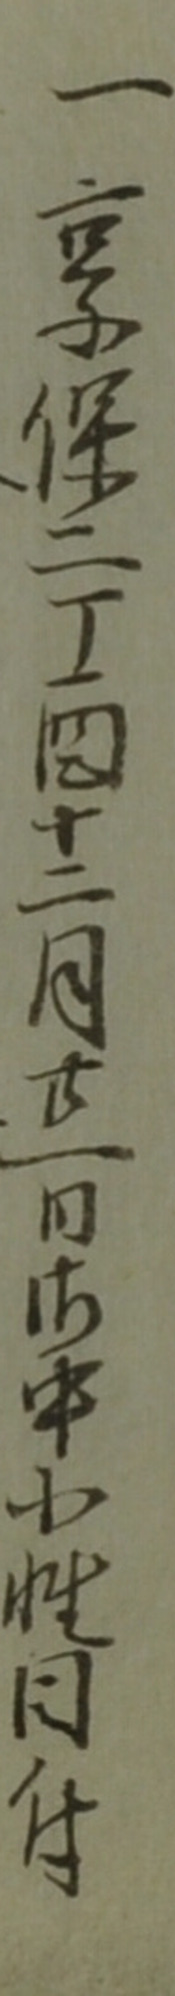一享保二丁酉十二月廿一日御中小姓目付
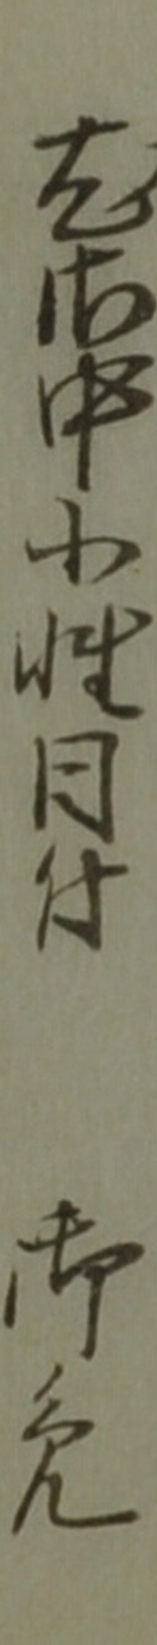尤御中小姓目付御免
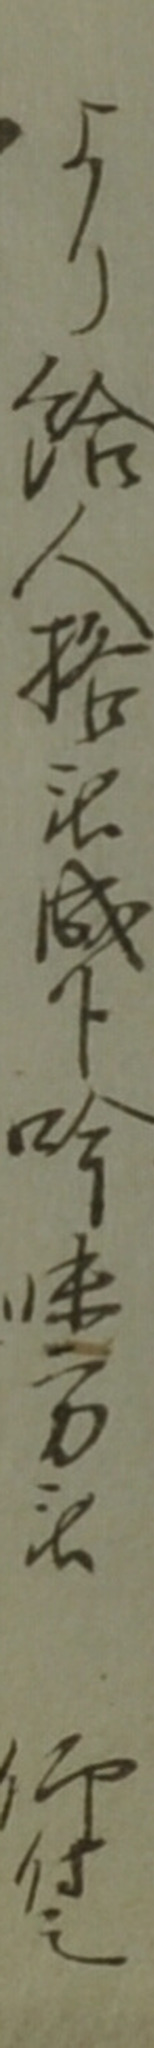より給人格被成下吟味方被仰付之
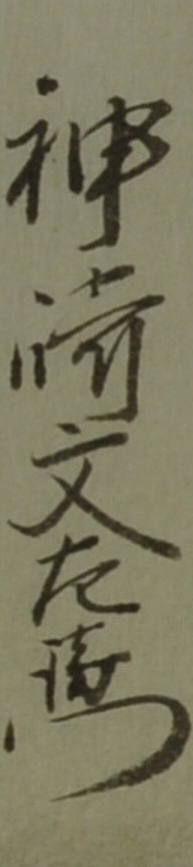神崎文左衛門
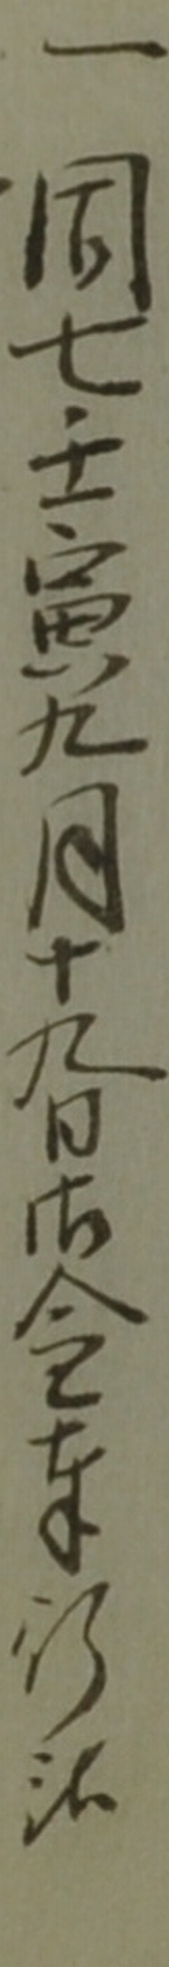一同七壬寅九月十九日御金奉行被
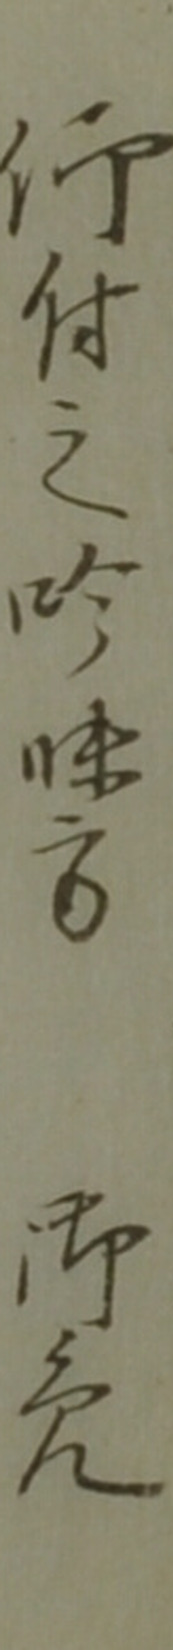仰付之吟味方御免
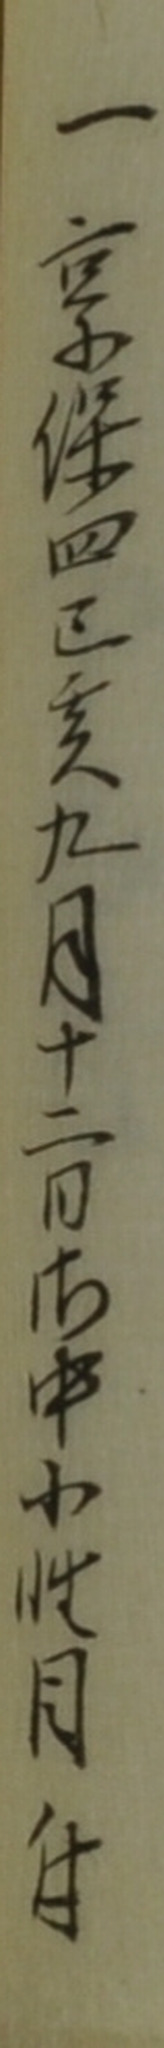一享保四己亥九月十二日御中小姓目付
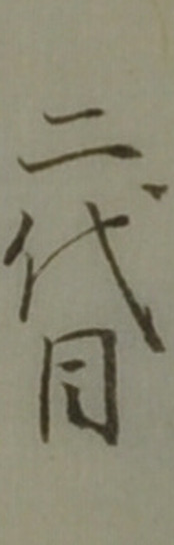二代目
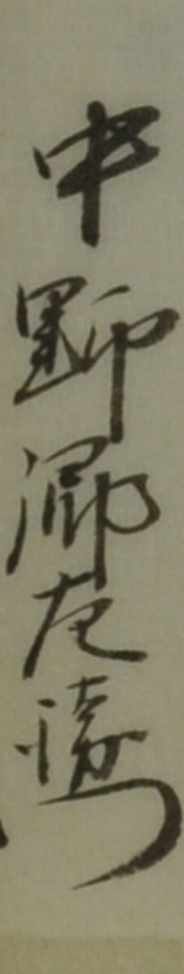中野郷左衛門
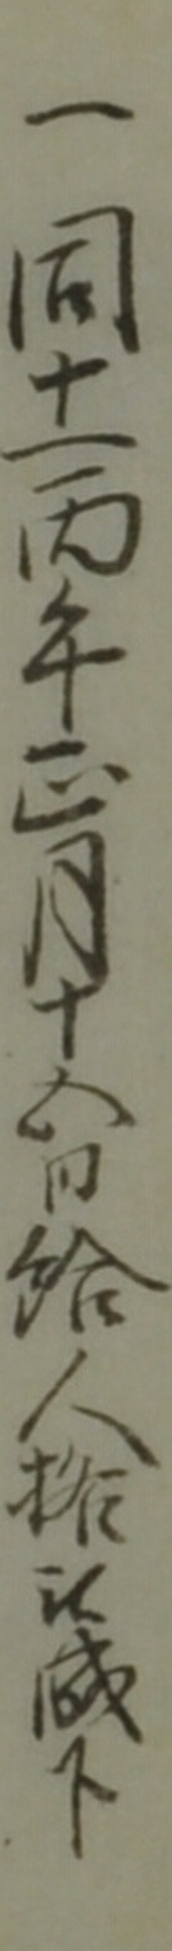一同十一丙午正月十五日給人格被成下
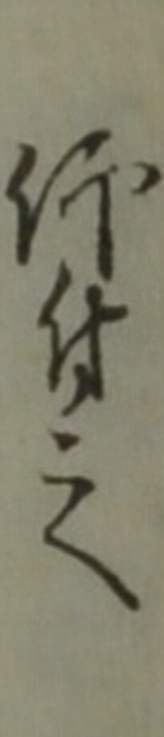仰付之
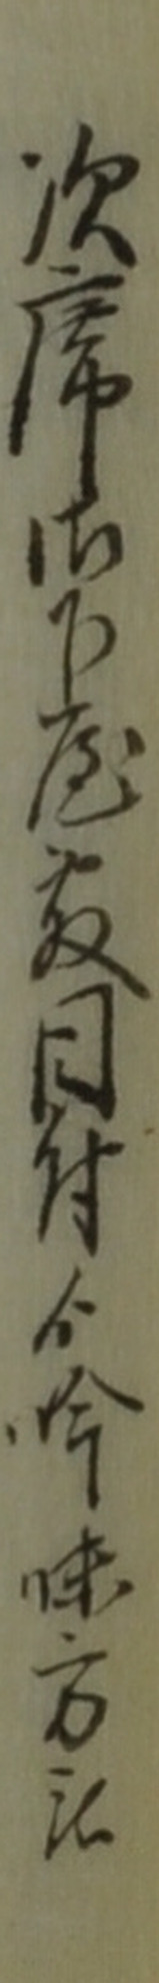次席御下屋敷目付より吟味方被
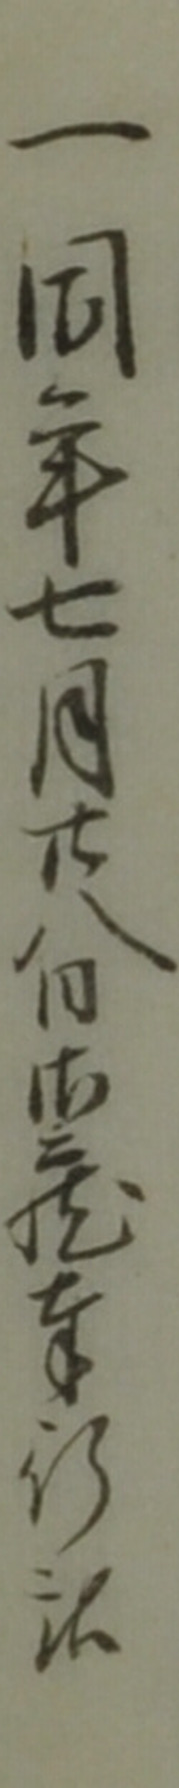一同年七月廿八日御蔵奉行被
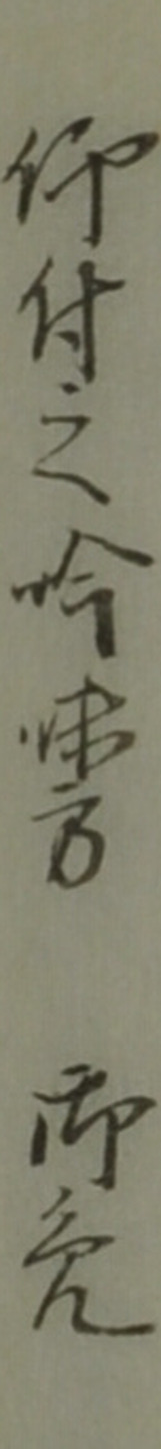仰付之吟味方御免
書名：諸御役代々録（八）
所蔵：伊那市立高遠町図書館・合同会社AMANE
